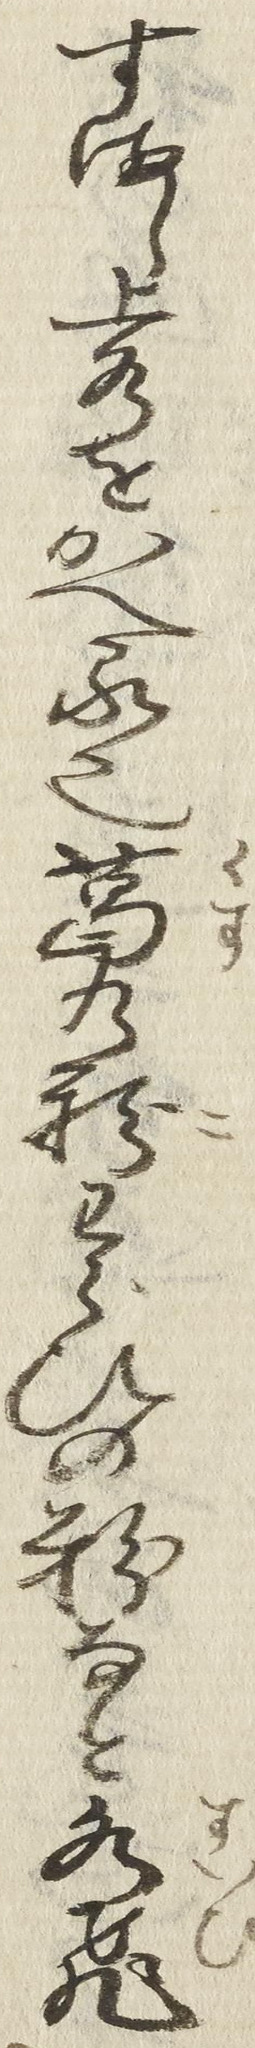すまし上水をかへる也葛の粉わらひの粉なと水飛
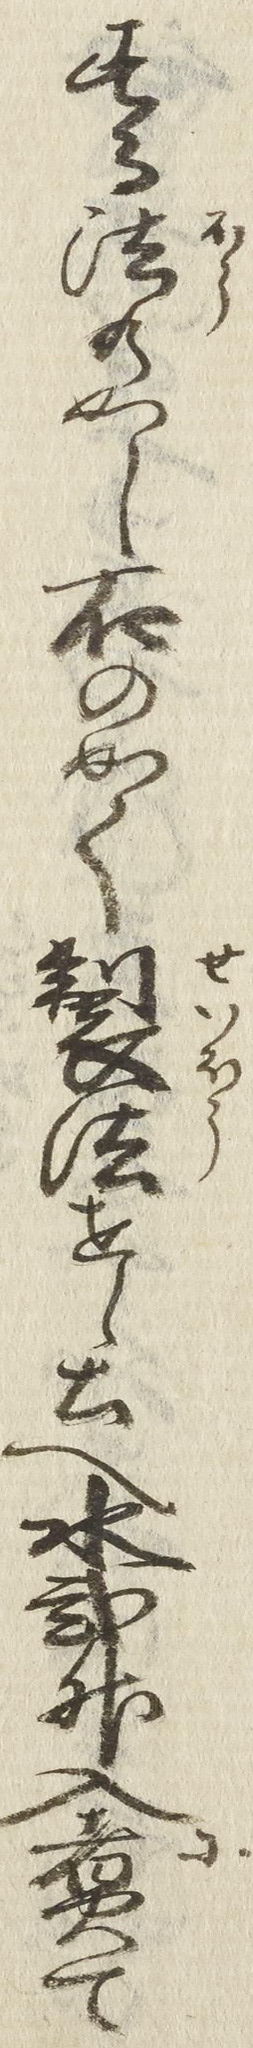する法の如し右の如く製法せし土へ水弐升入煮て
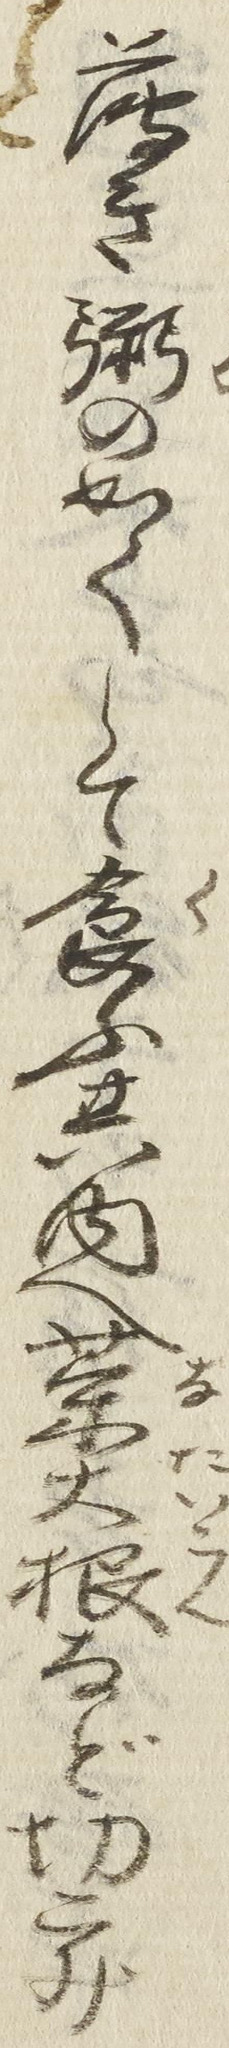薄き粥の如くして食ふ其内へ菜大根など切こみ
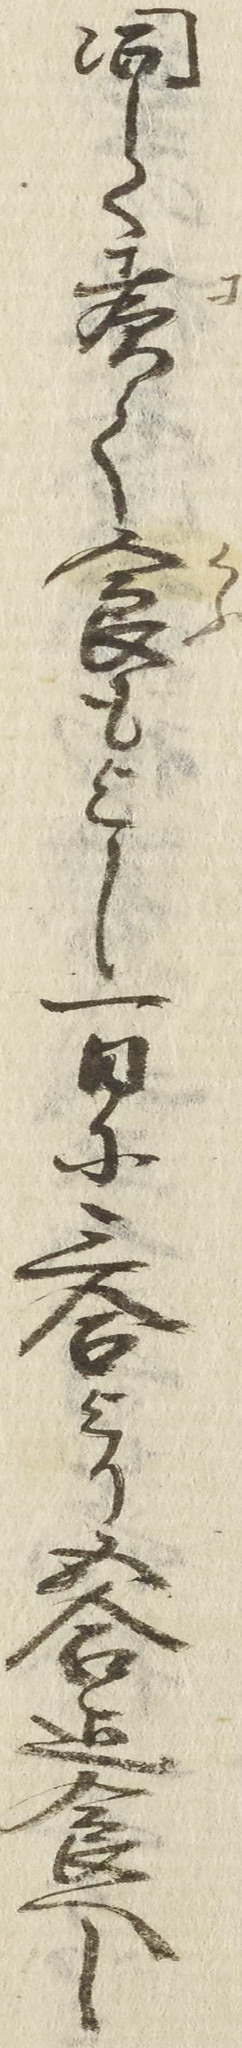同しく煮て食もよし一日に三合より五合迄食へし
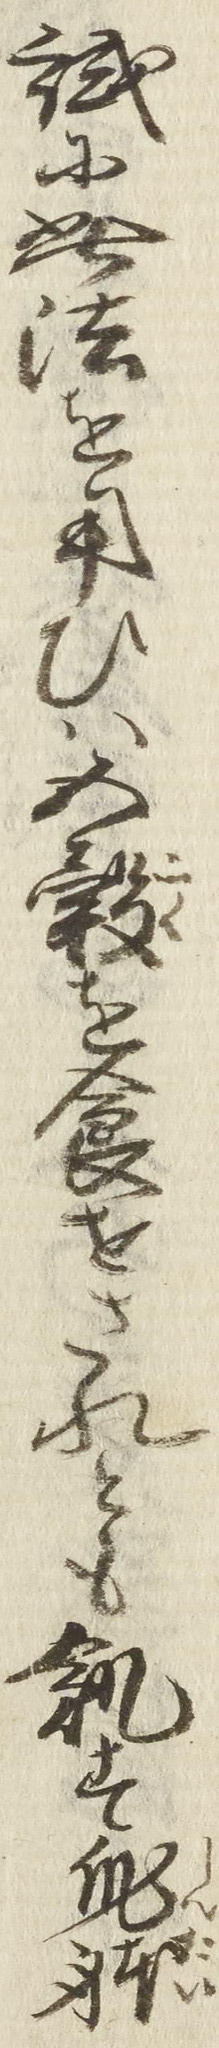誠に此法を用ひは五穀を食せされとも飢す身体
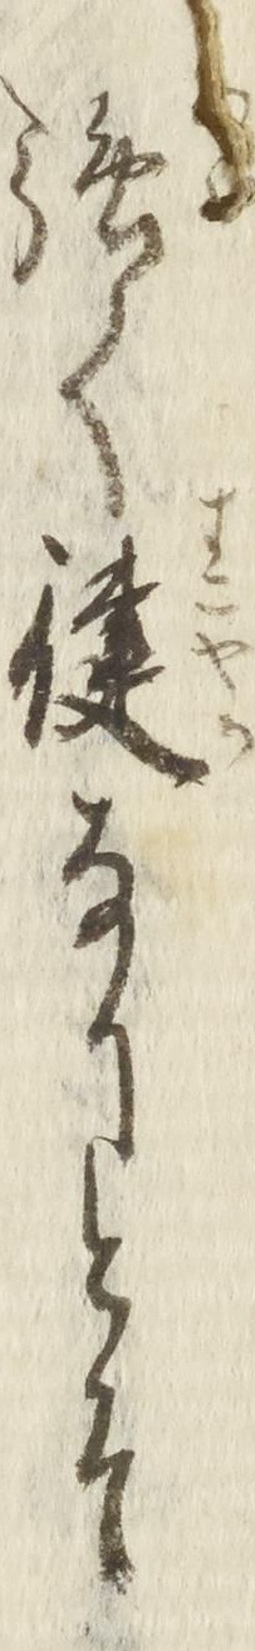強く健なりとそ
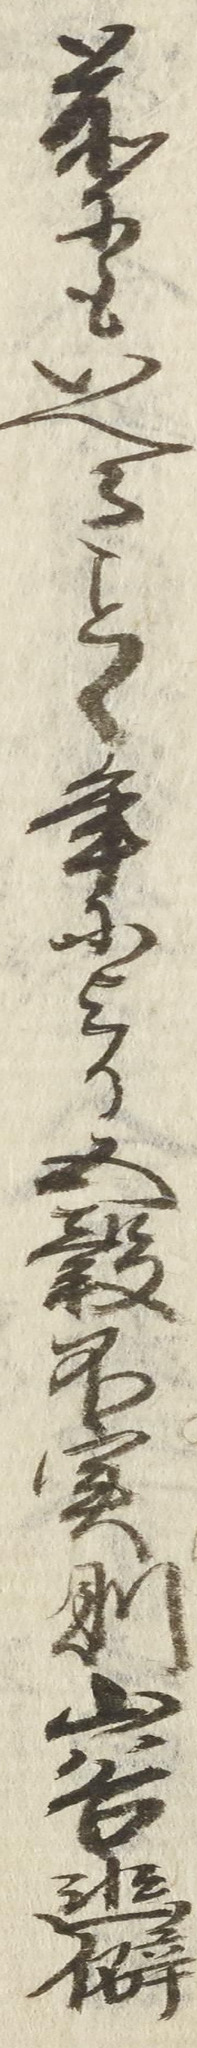前にもいへることく年により五穀不実則山谷幽僻
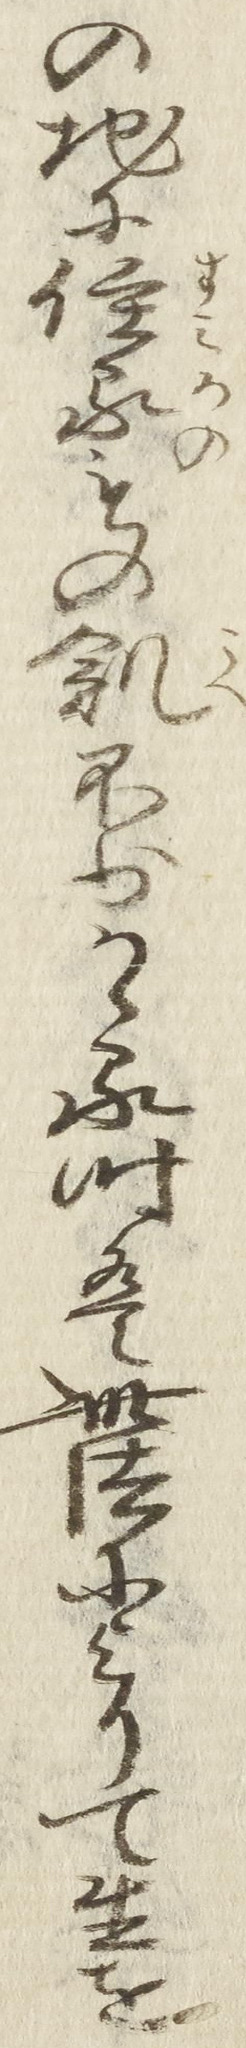の地に住家もの飢不少かゝる時は此法によりて生を
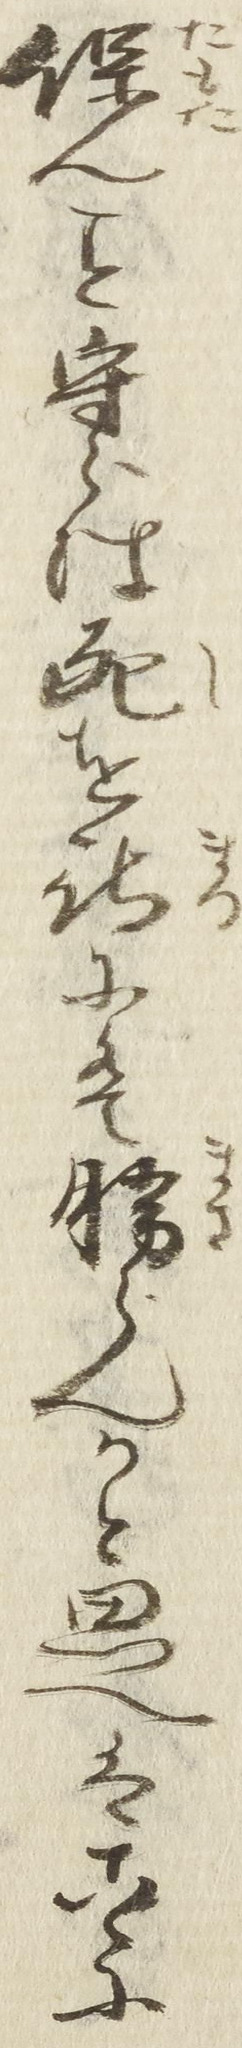保んこと守らは死を待には勝らんかと思へはこゝに
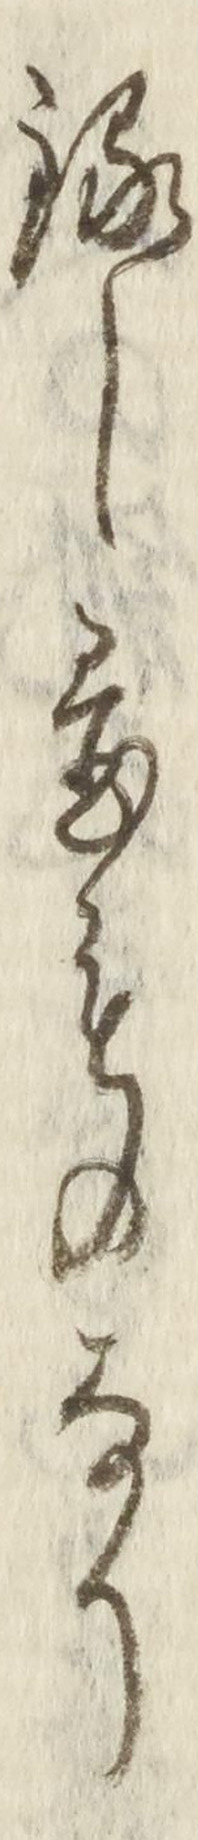録し置ものなり
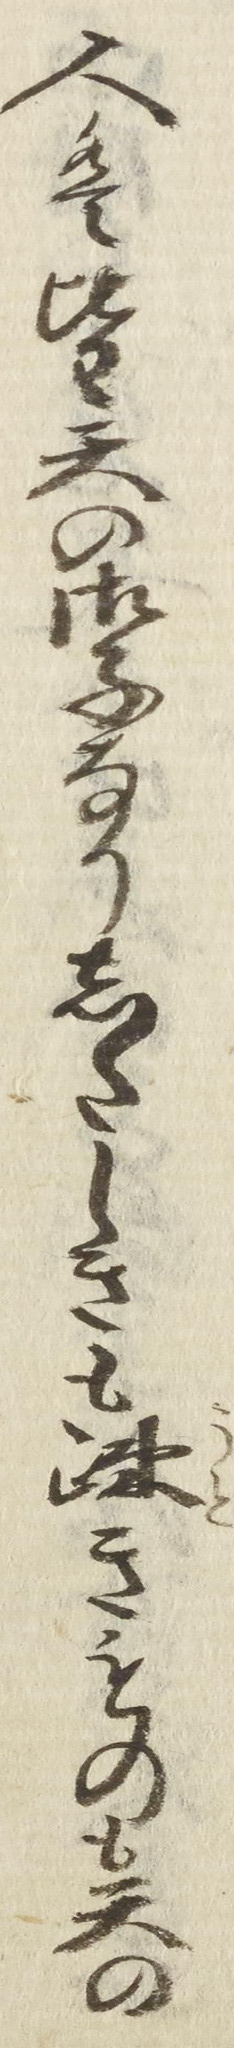人は皆天の御子なりしたしきも疎きものも天の

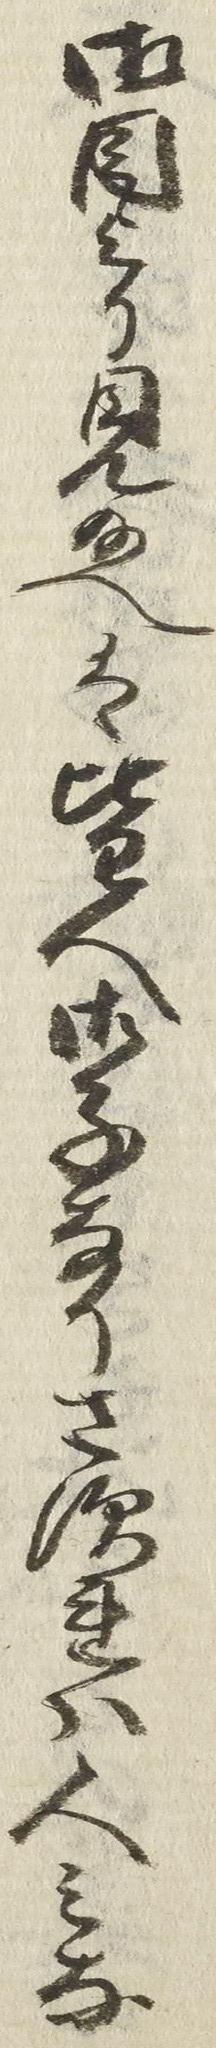御目より見給へは皆人御子なりさすれは人みな
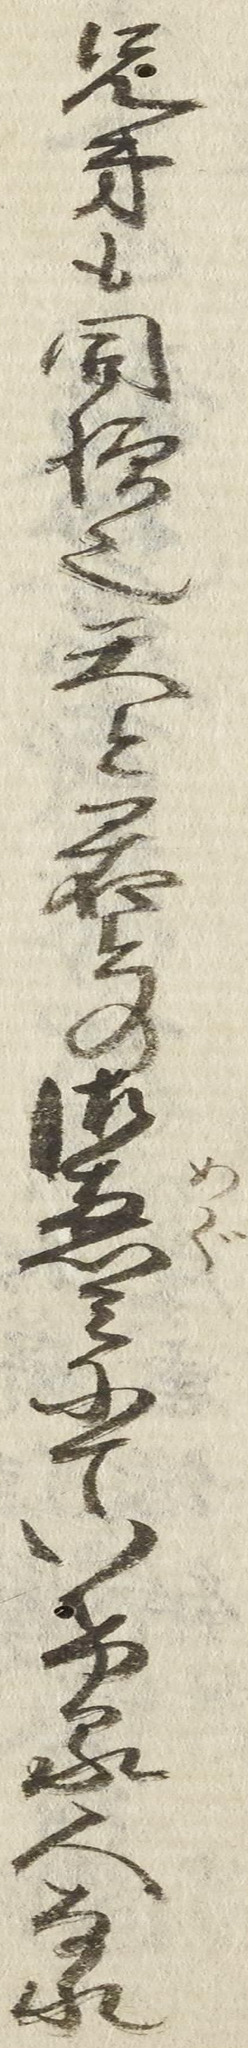兄弟も同様也天と君との御恵みにていける人なれ
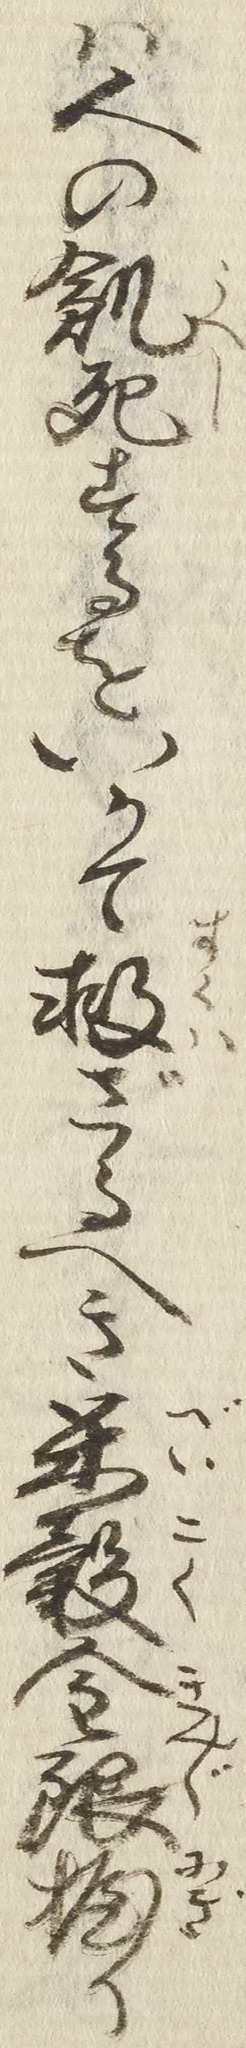は人の飢死するをいかて救ざるへき米穀金銀握り
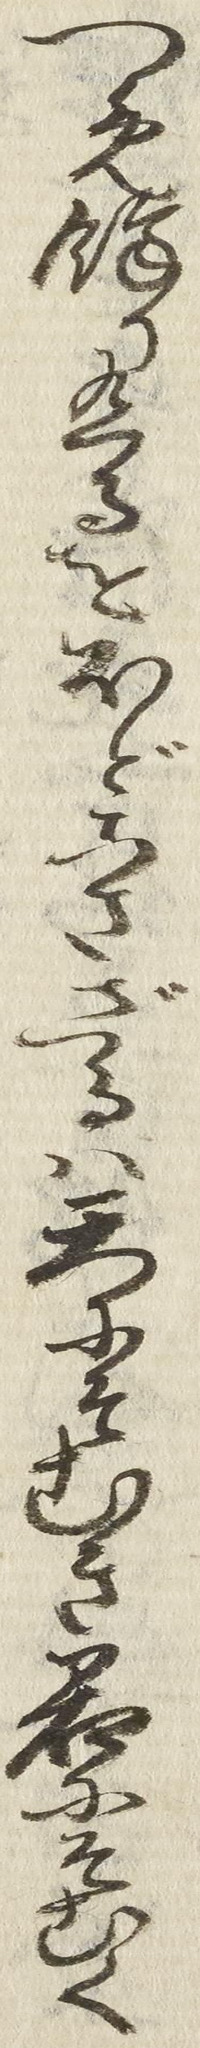つめ余り有るをほどこさざるは天にそむき君にそむく
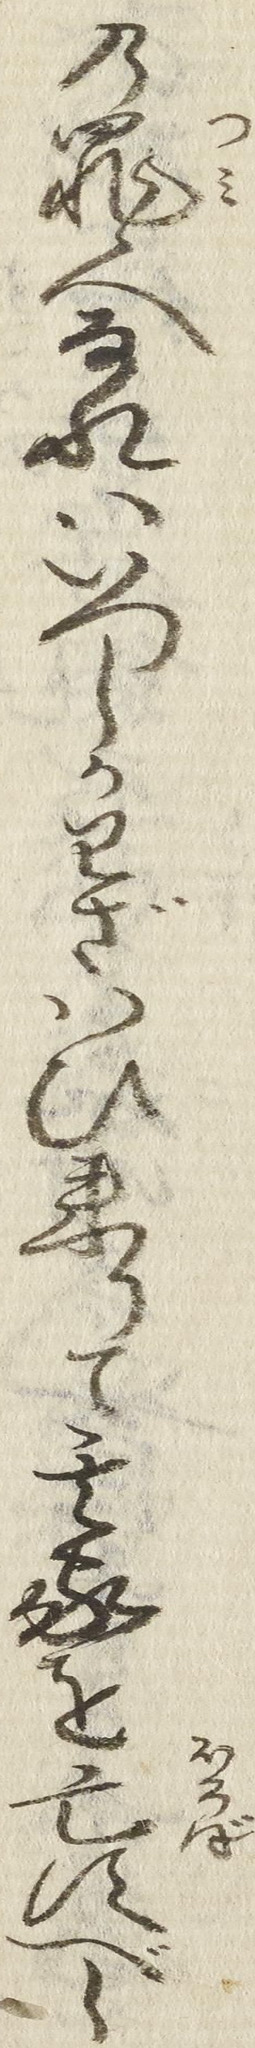の罪人なれはいつしかわざはい来りて其家を亡すべし
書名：天明奇畧　全
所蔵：東京大学地震研究所図書室 Earthquake Research Institute Library, The University of Tokyo, JAPAN
